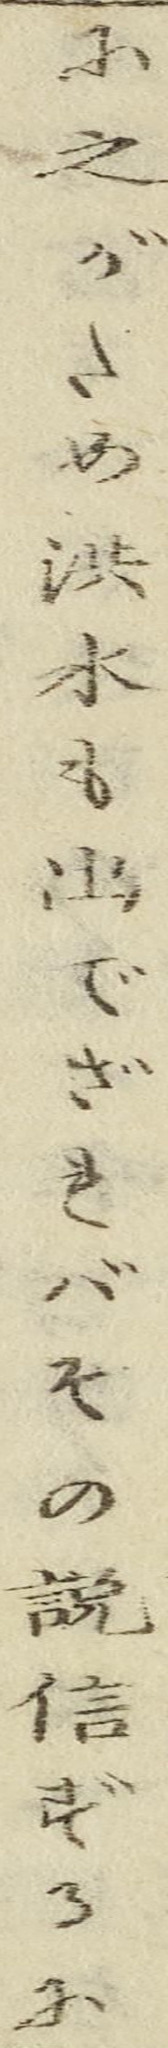に之がため洪水も出でざればその説信ずるに
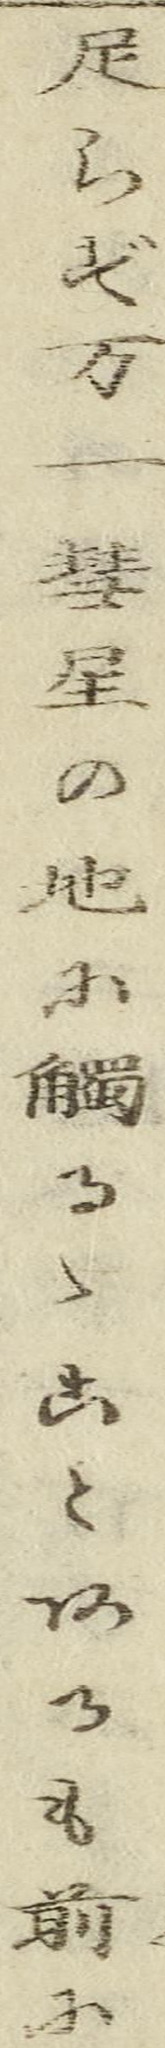足らず万一彗星の地に触るゝことあるも前に
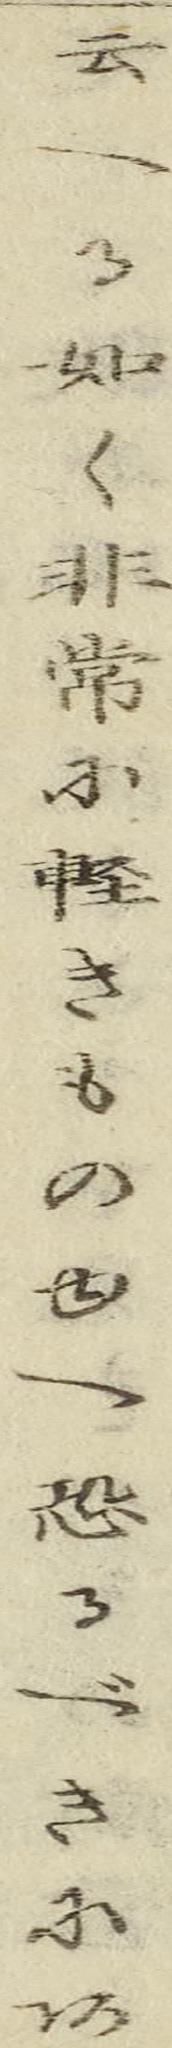云へる如く非常に軽きものゆへ恐るべきにあ
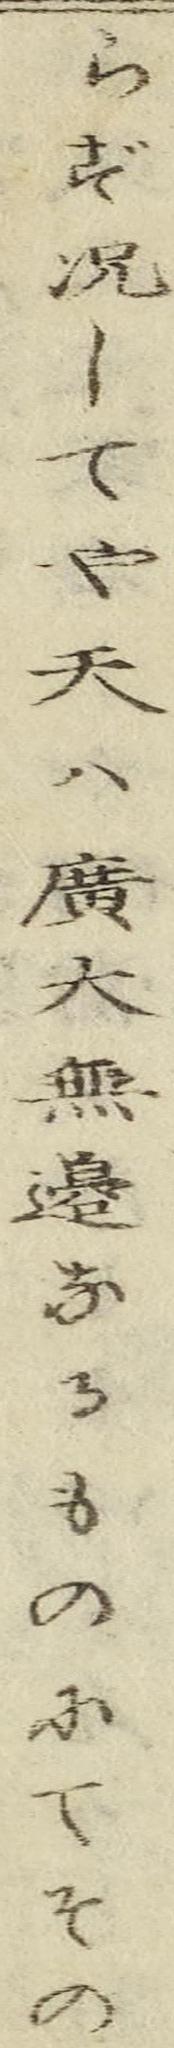らず況してや天は広大無辺なるものにてその
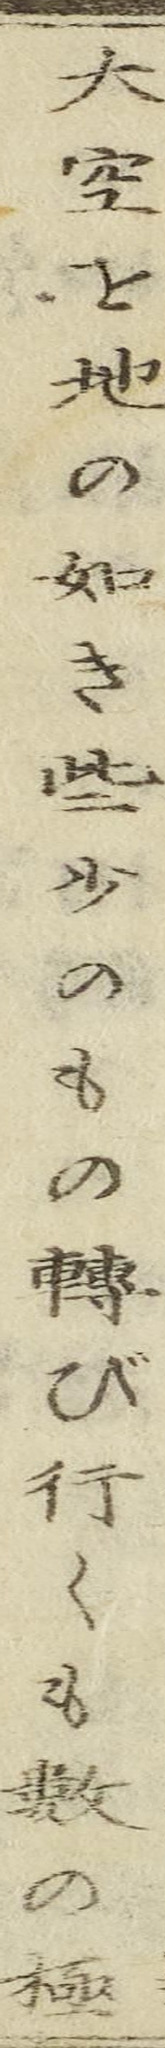大空を地の如き些少のもの転び行くも数の極
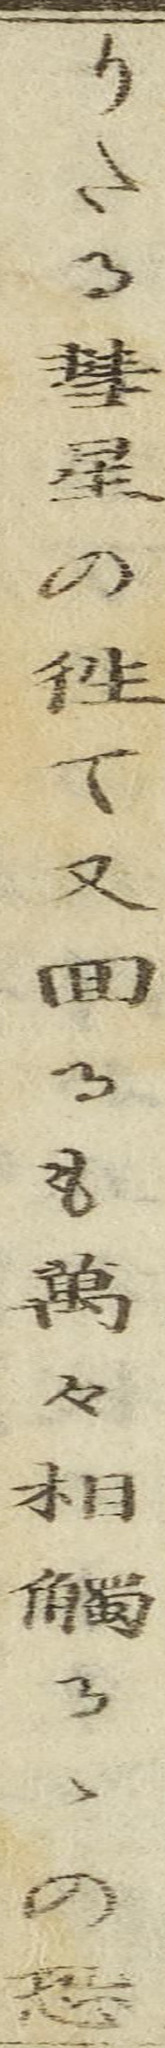りたる彗星の往て又回るも万々相触るゝの恐

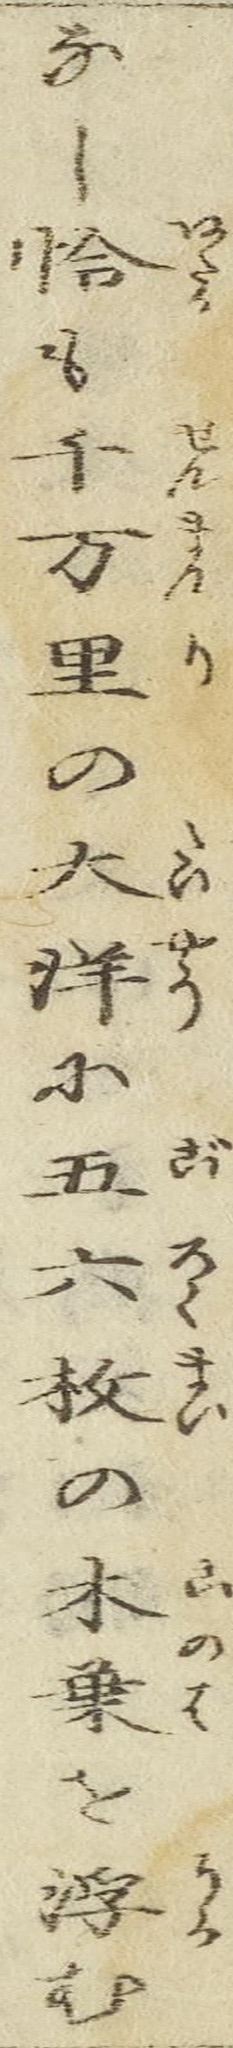なし恰も千万里の大洋に五六枚の木葉を浮む
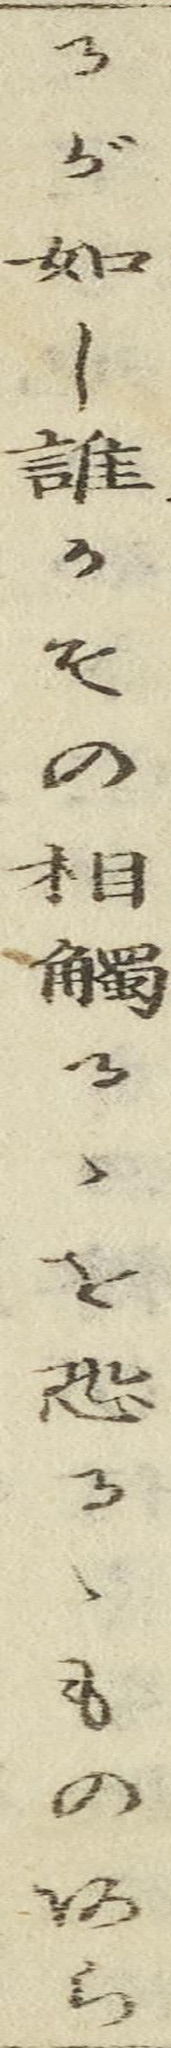るが如し誰かその相触るゝを恐るゝものあら
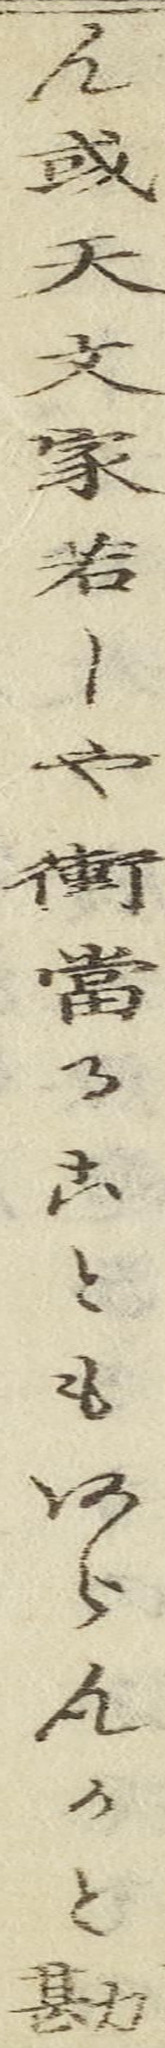ん或天文家若しや衝当ることもあらんかと勘
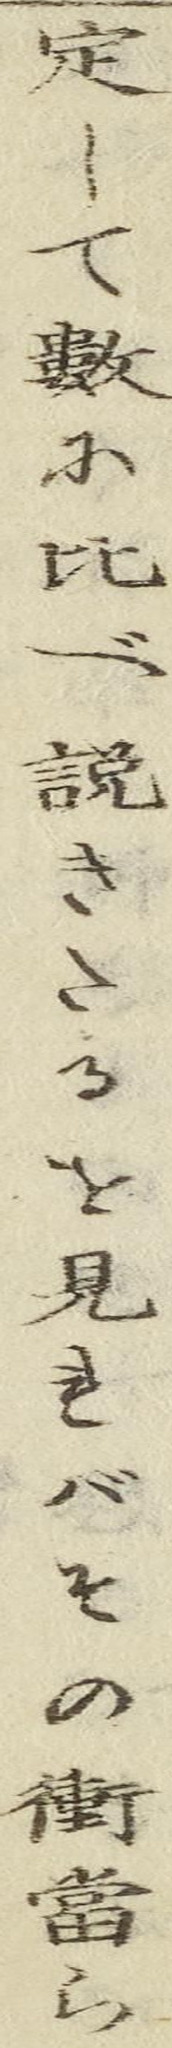定して数に比べ説きたるを見ればその衝当ら
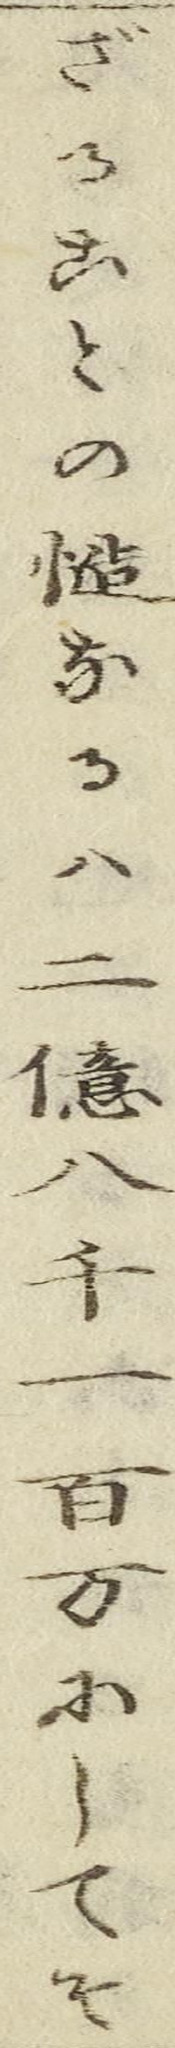ざることの慥なるは二億八千一百万にしてそ
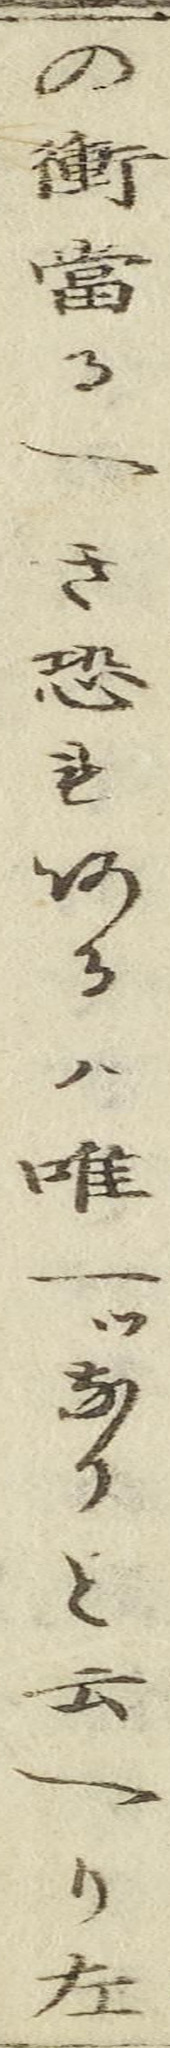の衝当るへき恐れあるは唯一ツなりと云へり左
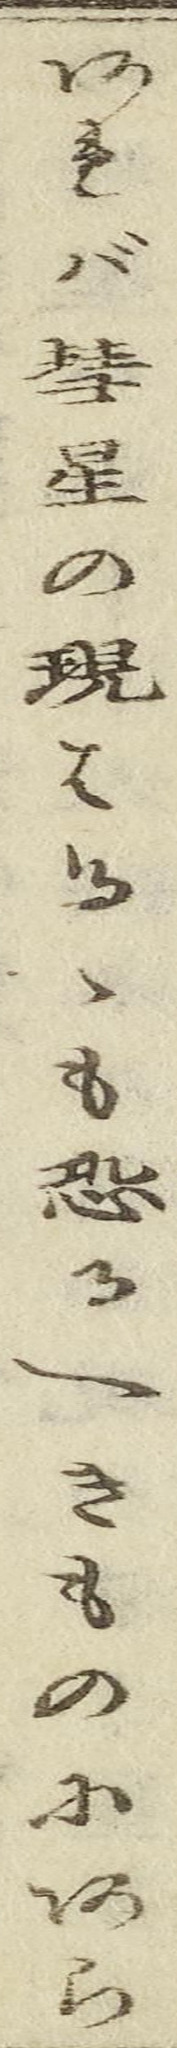あれば彗星の現はるゝも恐るへきものにあら
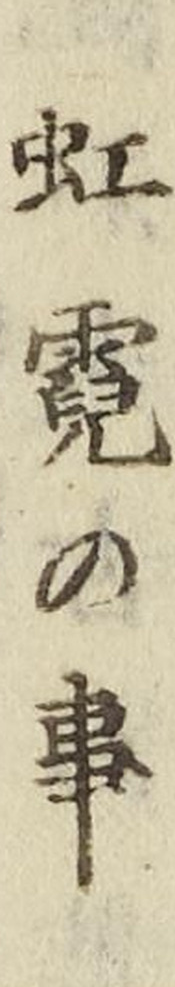虹霓の事
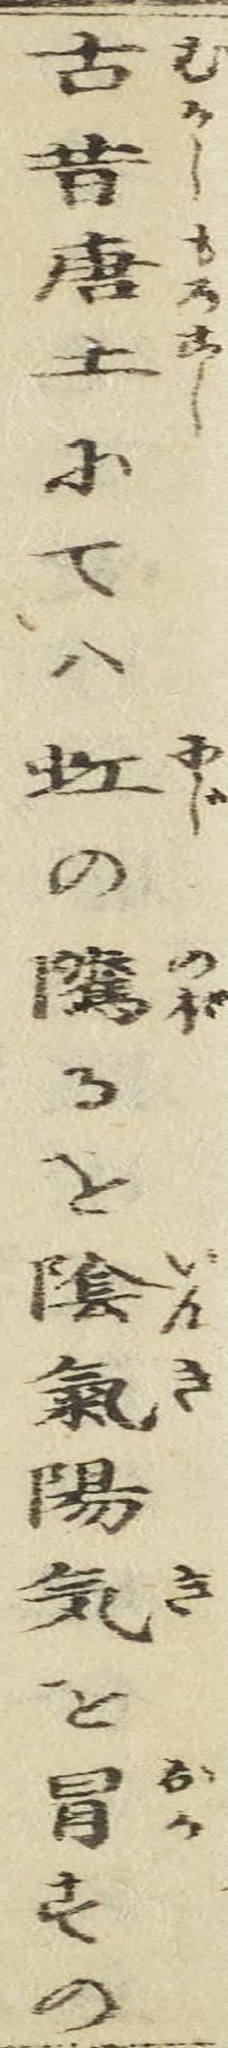古昔唐土にては虹の騭るを陰気陽気を冒すの
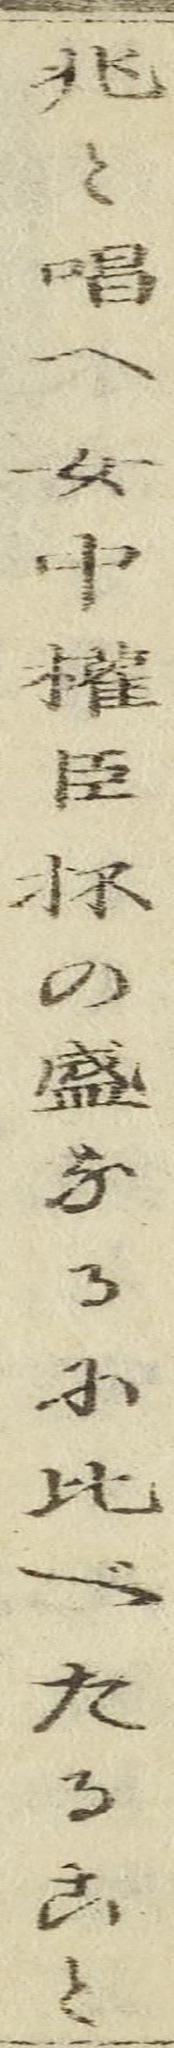兆と唱へ女中権臣抔の盛なるに比べたること
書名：天変地異
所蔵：東京大学地震研究所図書室 Earthquake Research Institute Library, The University of Tokyo, JAPAN
